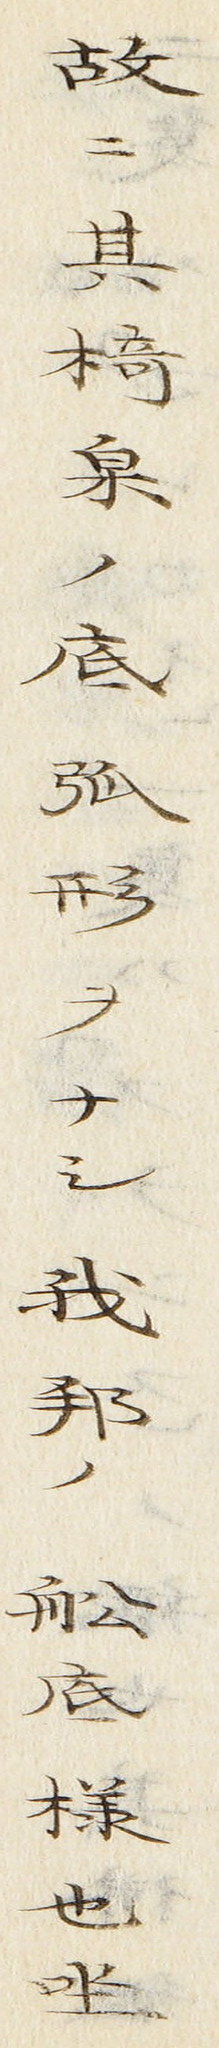故ニ其椅ノ底弧形ヲナシ我邦ノ船底様也坐
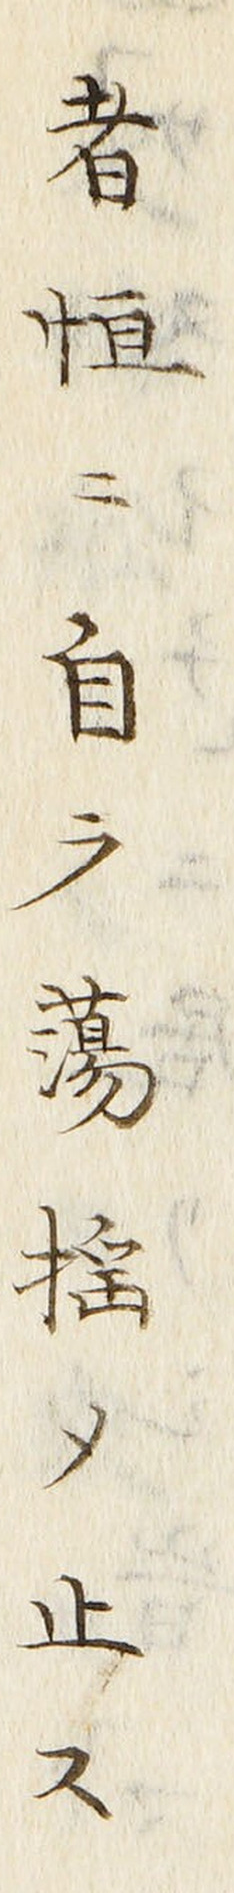者恒ニ自ラ蕩揺シテ止ス
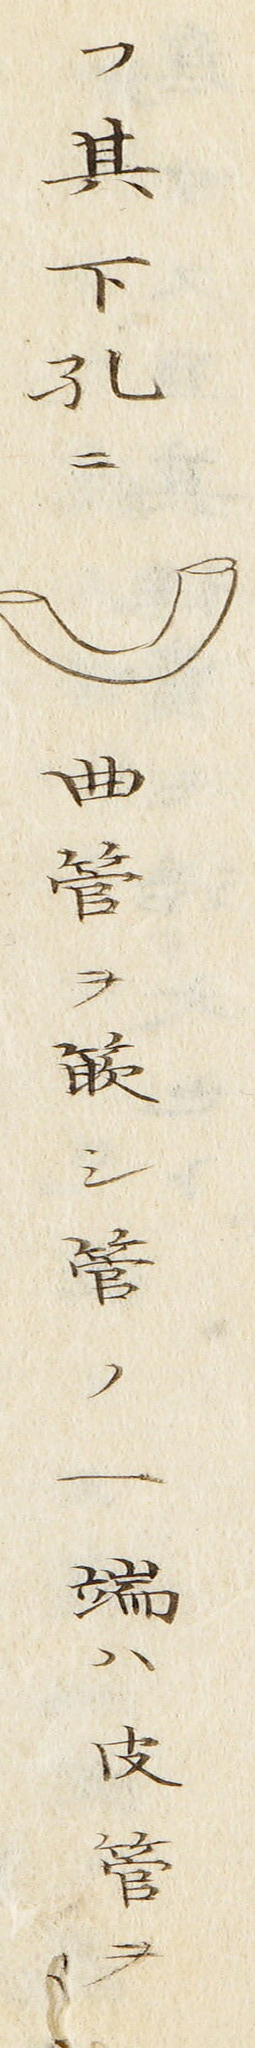フ其下孔ニ曲管ヲ嵌シ管ノ一端ハ皮管ヲ
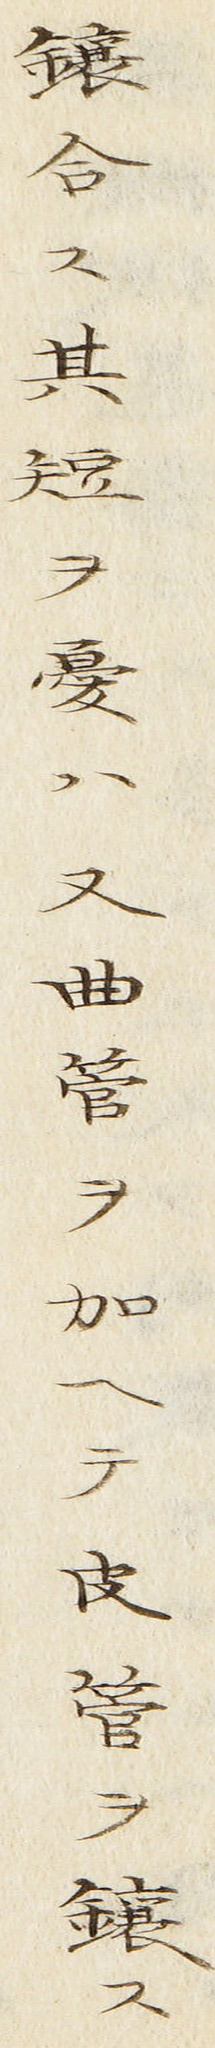鑲合ス其短ヲ憂ハ又曲管ヲ加ヘテ皮管ヲ鑲ス
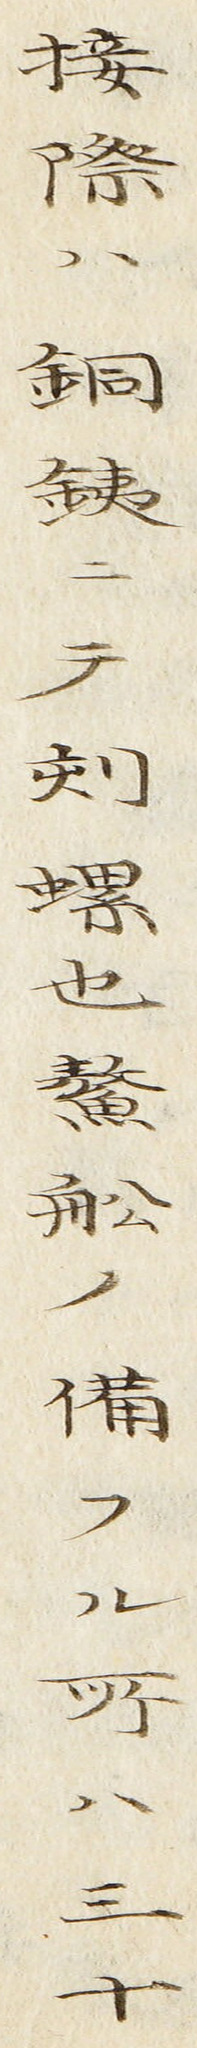接際ハ銅銕ニテ刻螺也鰲舩ノ備フル所ハ三十
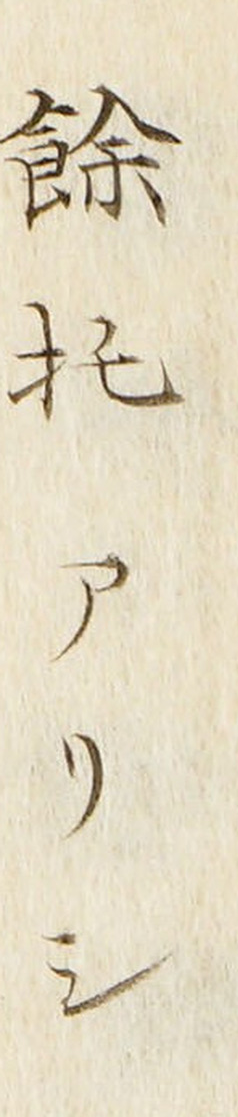餘托アリシ
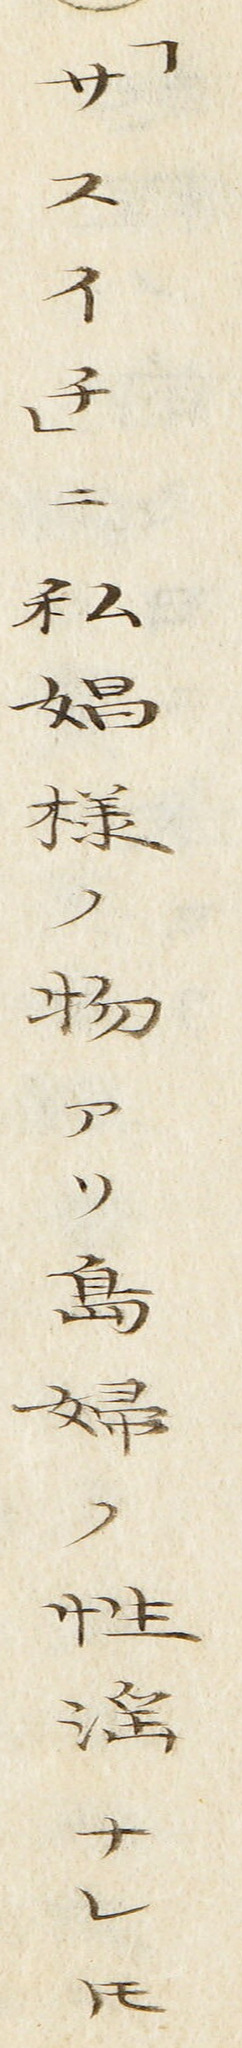○「サスイチ」ニ私娼様ノ物アリ島婦ノ性淫ナレトモ
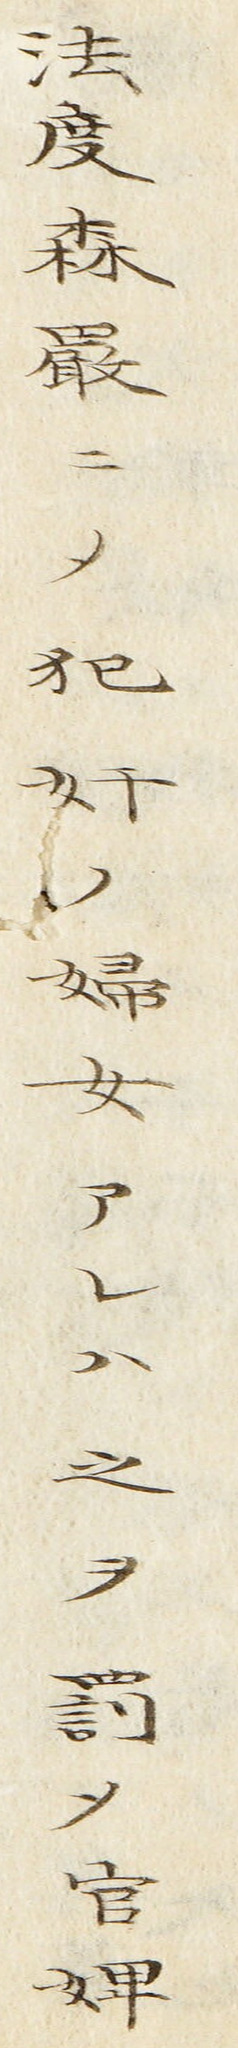法度森厳ニシテ犯奸ノ婦女アレハ之ヲ罰シテ官婢
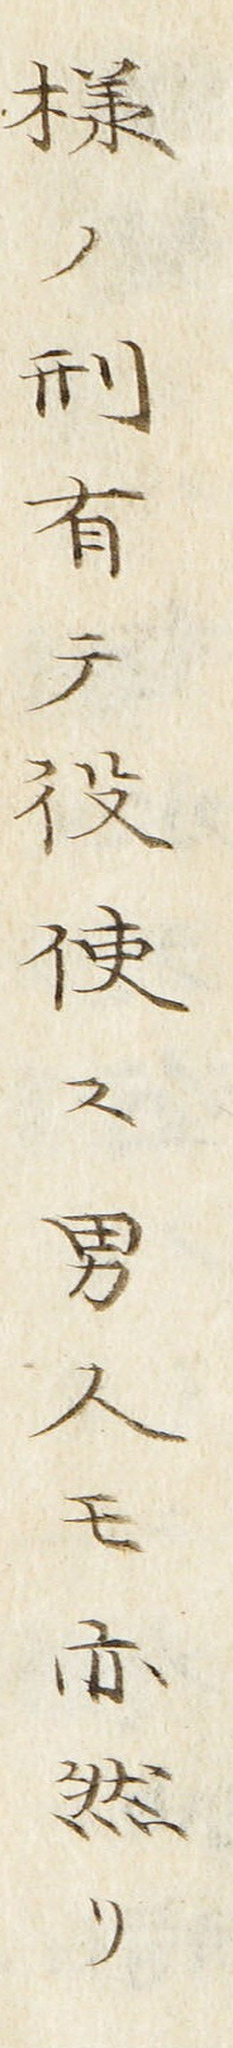様ノ刑有テ役使ス男人モ亦然リ
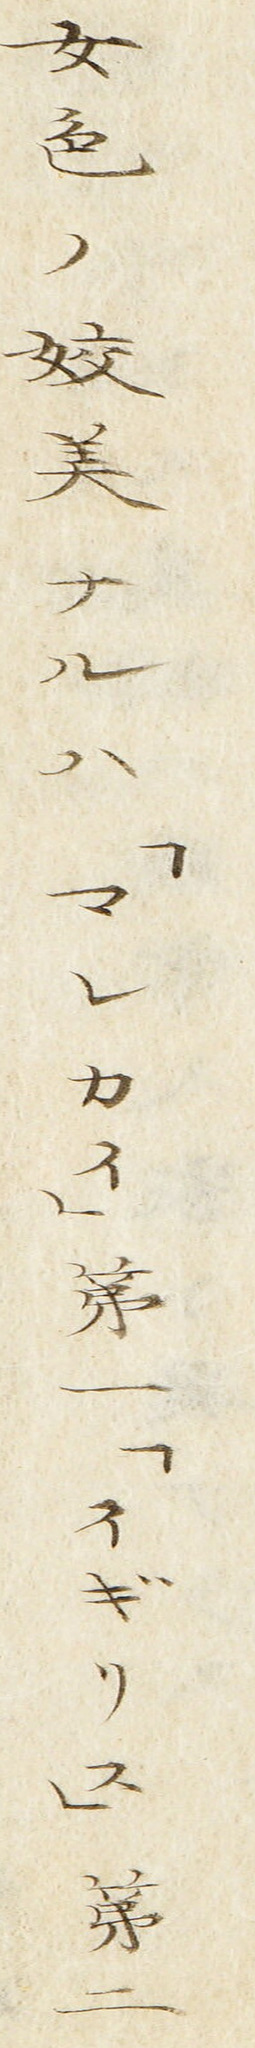○女色ノ姣美ナルハ「マレカイ」第一「イギリス」第二
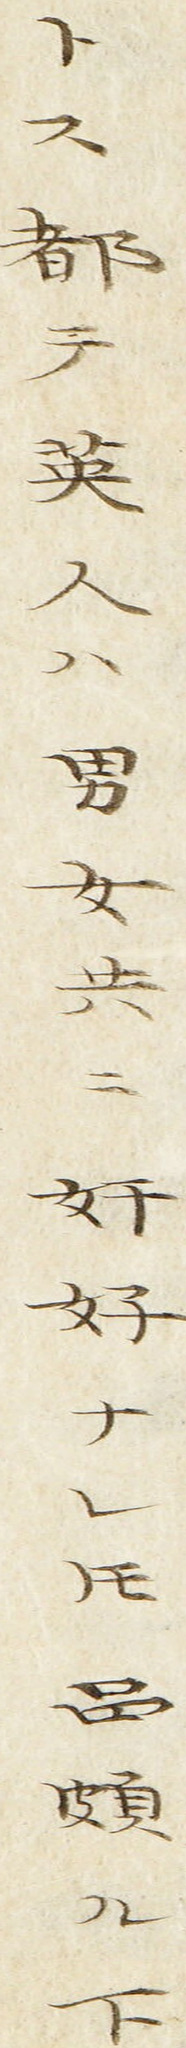トス都テ英人ハ男女共ニ奸好ナレトモ品頗ル下
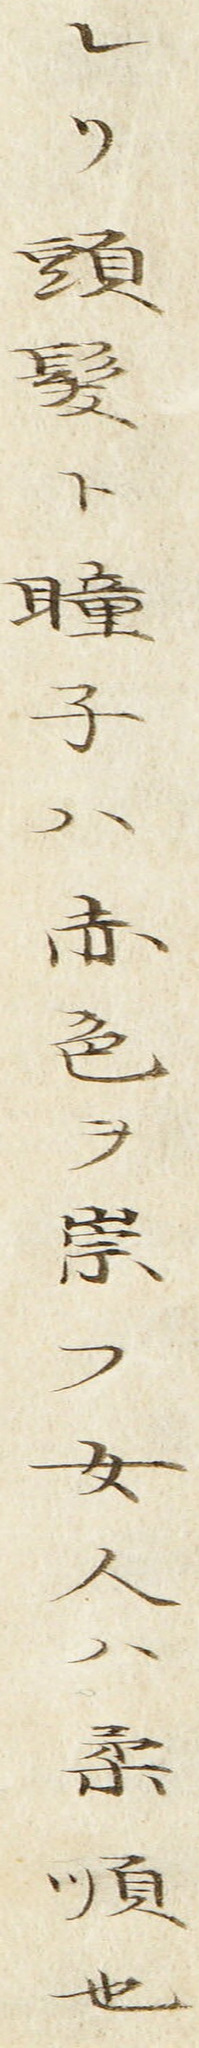レリ頭髪ト瞳子ハ赤色ヲ崇フ女人ハ柔順也

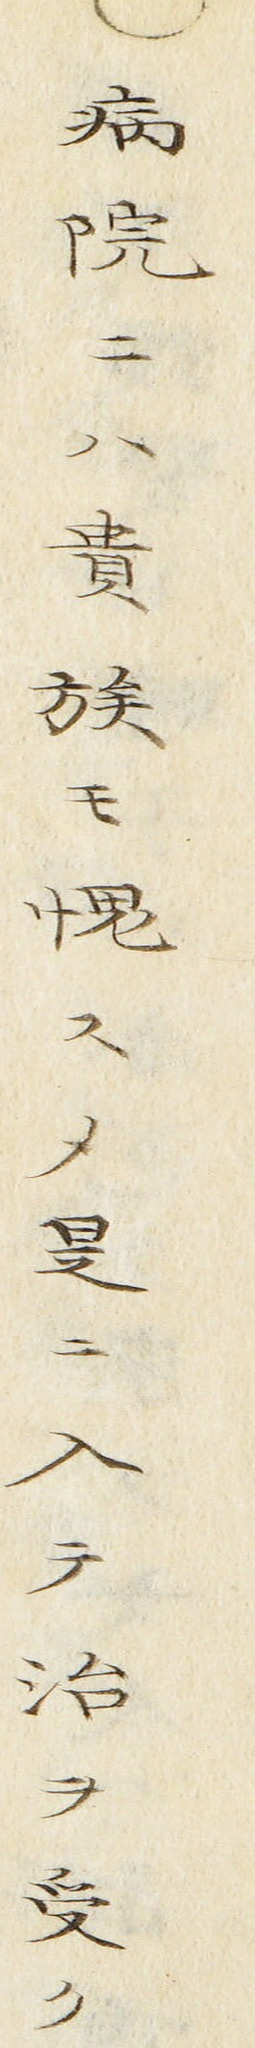○病院ニハ貴族モ愧スシテ是ニ入テ治ヲ受ク
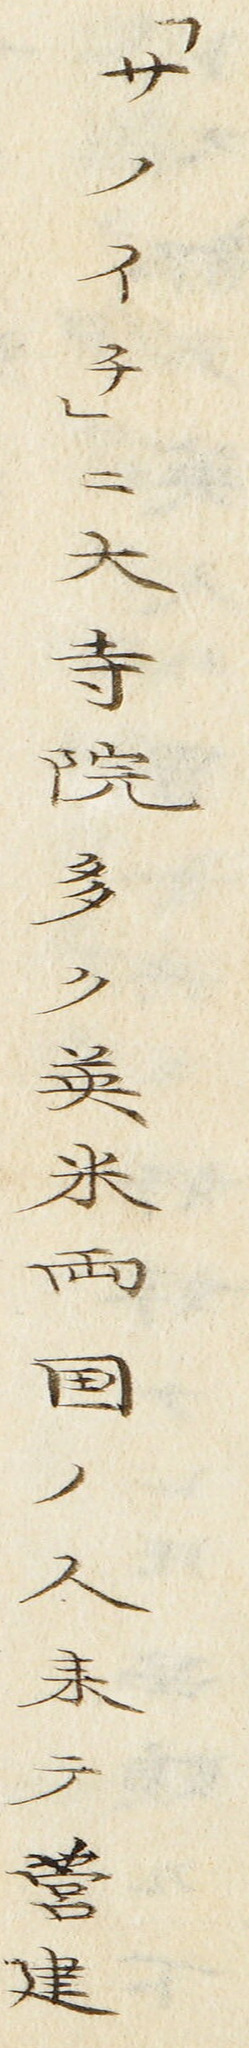〇「サノイチ」ニ大寺院多ク英米両国ノ人来テ営建
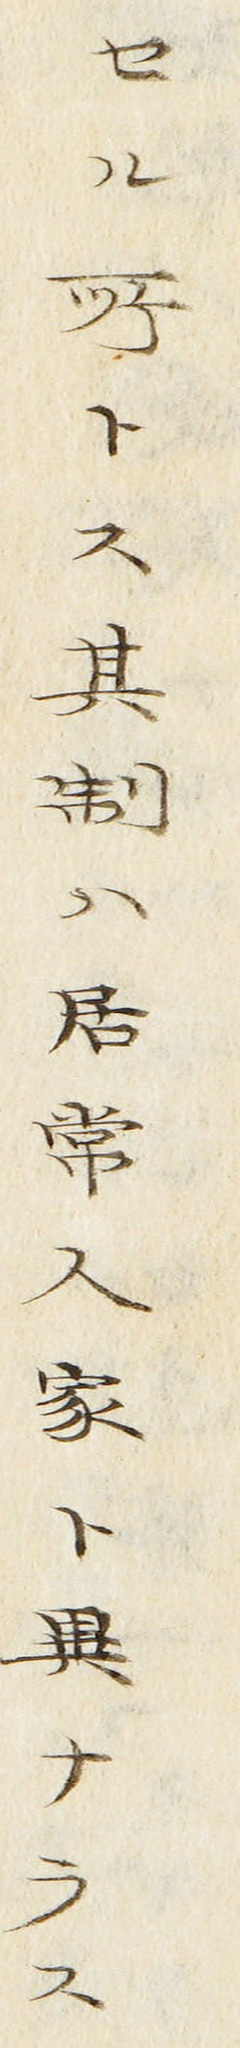セル所トス其制ハ居常人家ト異ナラス
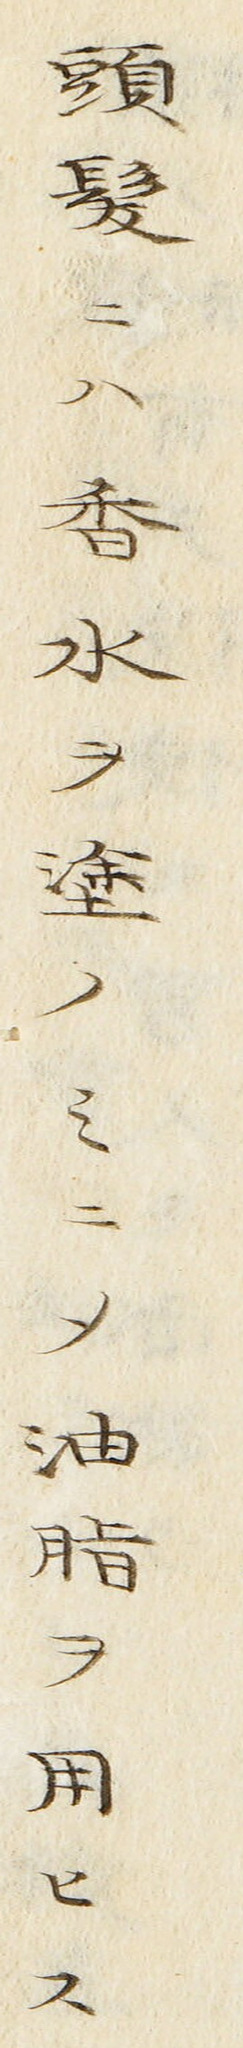○頭髪ニハ香水ヲ塗ノミニシテ油脂ヲ用ヒス
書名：蕃談
